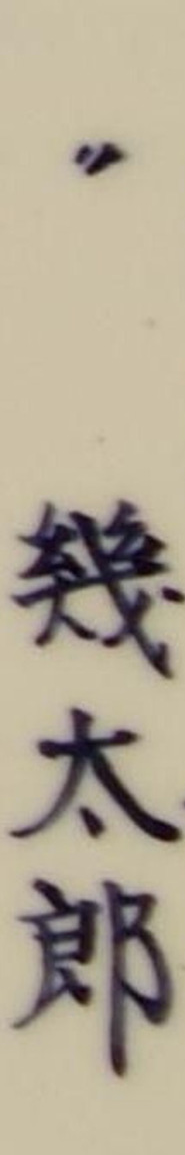幾太郎
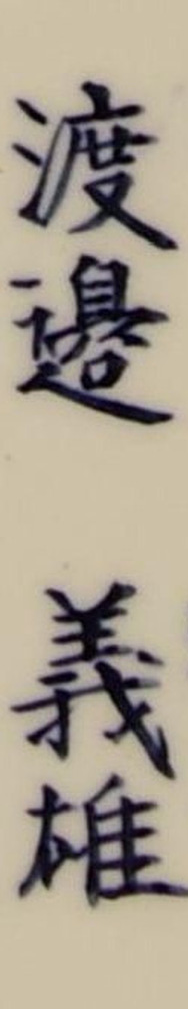渡辺義雄
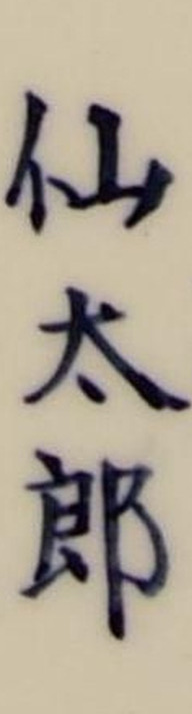仙太郎
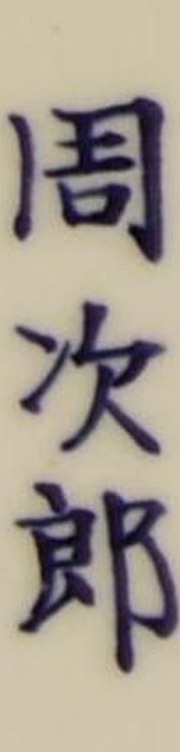周次郎

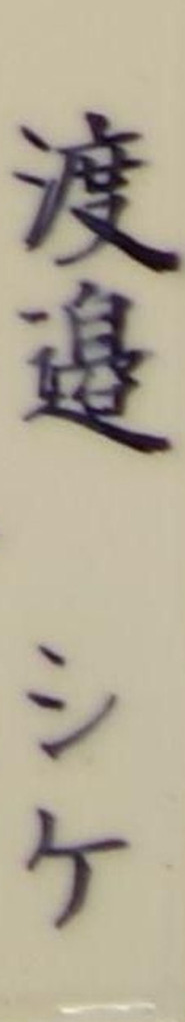渡辺シケ
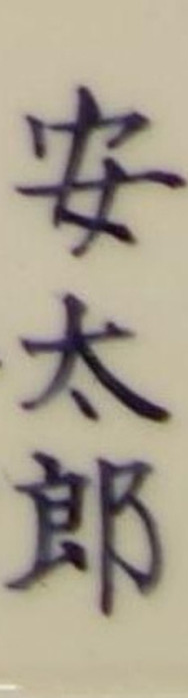安太郎
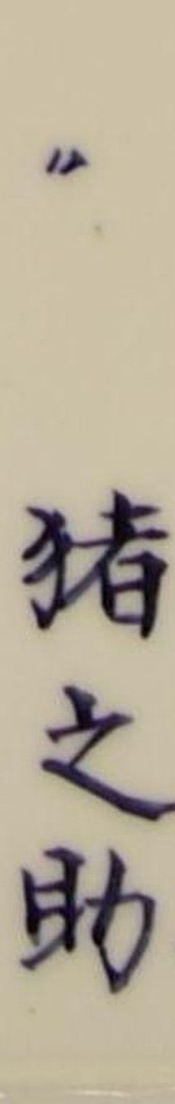猪之助
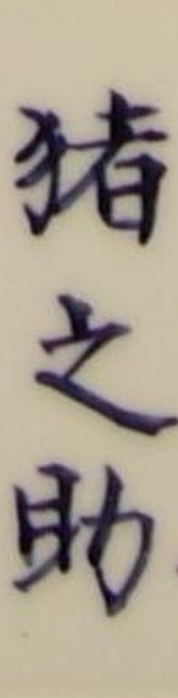猪之助
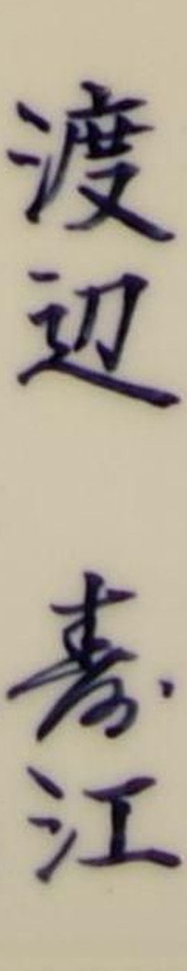渡辺す江
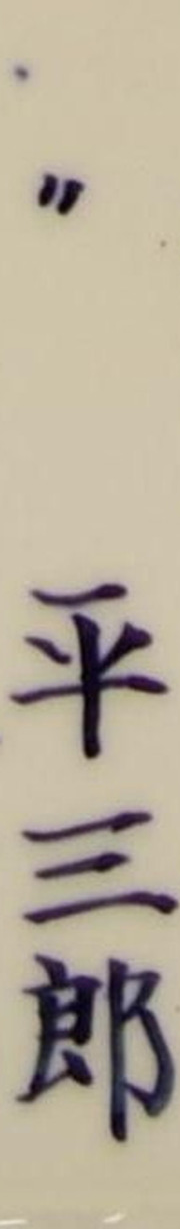平三郎
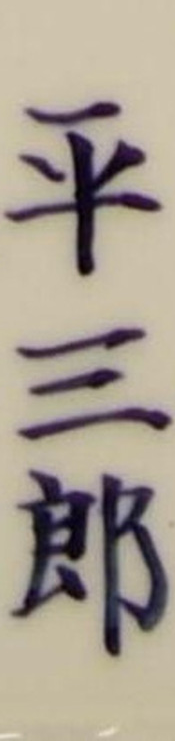平三郎
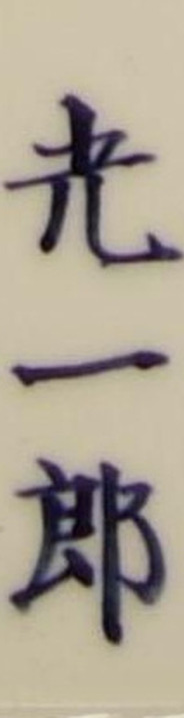光一郎
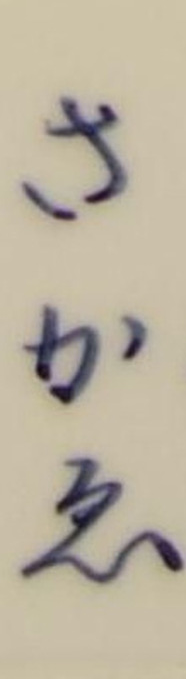さかゑ
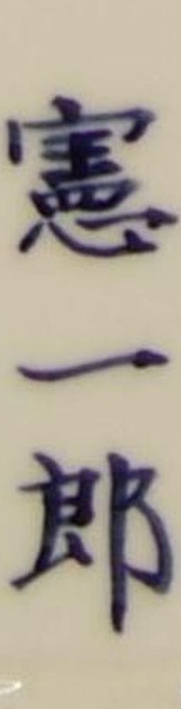憲一郎
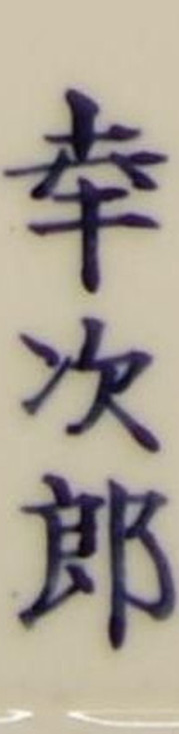幸次郎

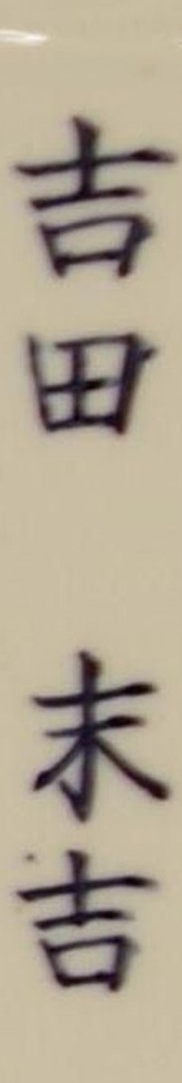吉田末吉
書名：A~D
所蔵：koyasan kongobuji
